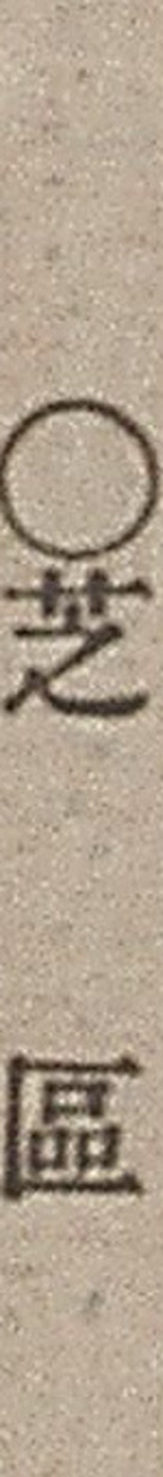〇芝区
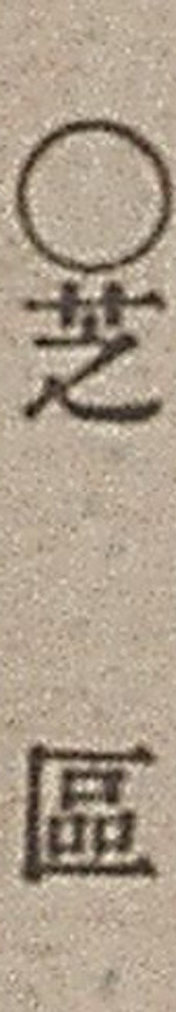〇芝区
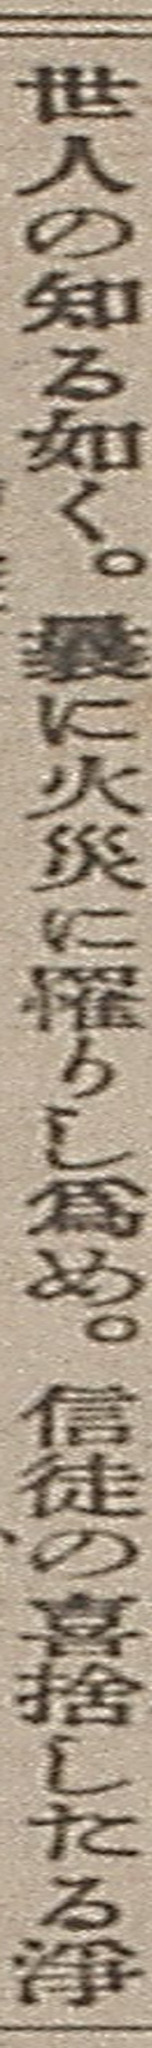世人の知る如く。曩に火災に罹りし為め。信徒の喜捨したる浄
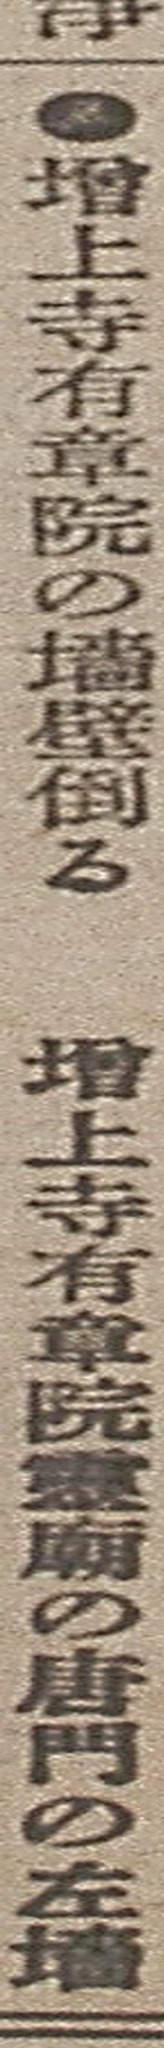●増上寺有章院の墻壁倒る増上寺有章院霊廟の唐門の左墻
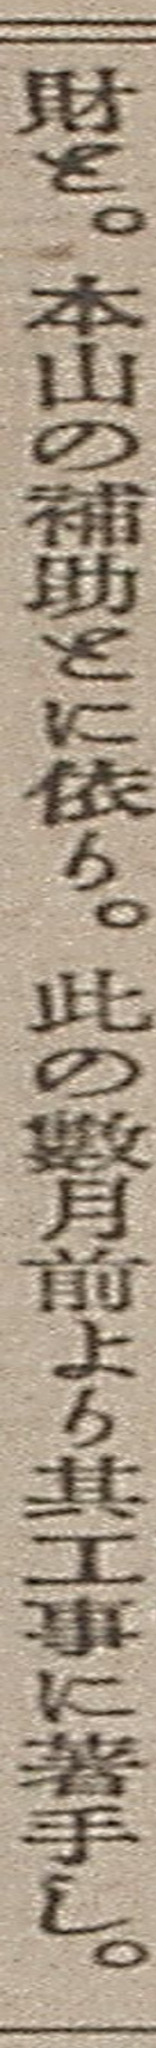財と。本山の補助とに依り。此の数月前より其工事に著手し。
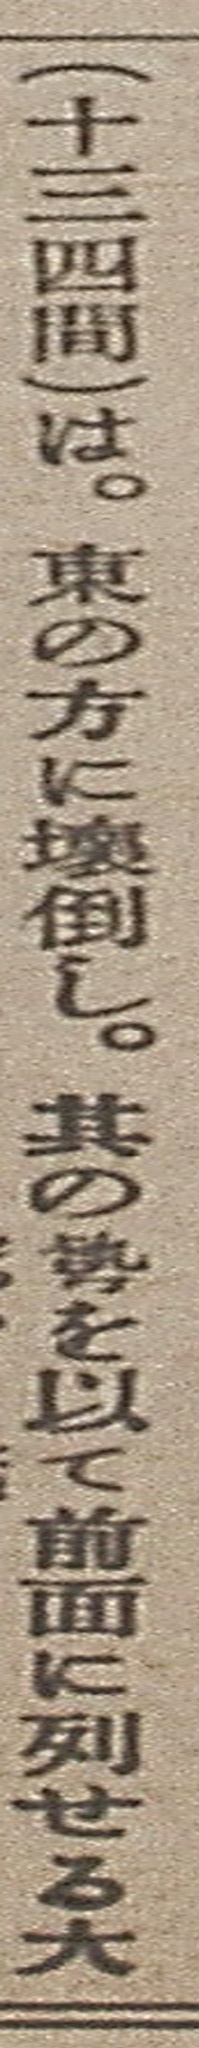は。東の方に潰倒し。其の勢を以て前面に列せる大
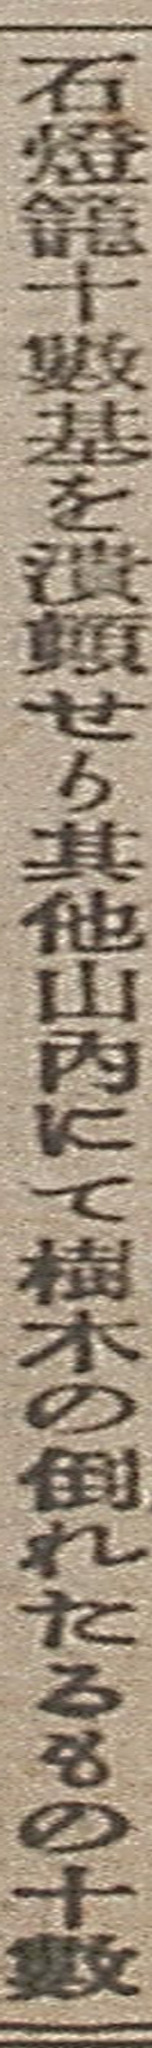石燈籠十数基を潰顛せり其他山内にて樹木の倒れたるもの十数
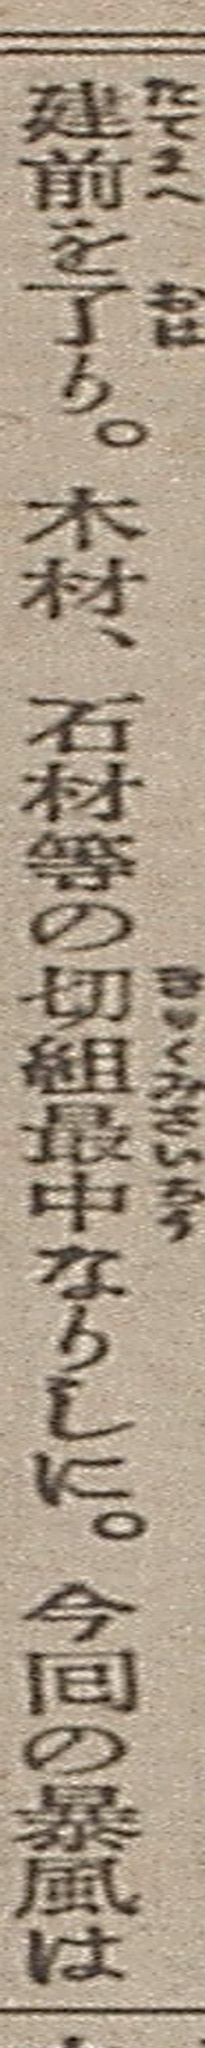建前を了り。木材、石材等の切組最中なりしに。今回の暴風は
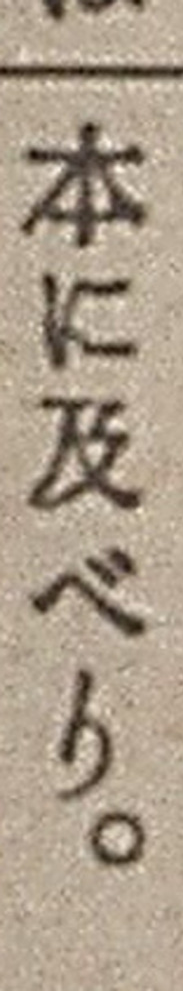本に及べり。
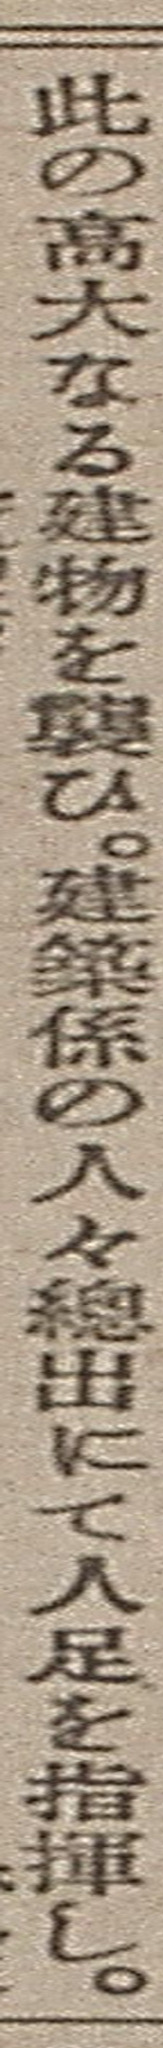此の高大なる建物を襲ひ。建築係の人々総出にて人足を指揮し。
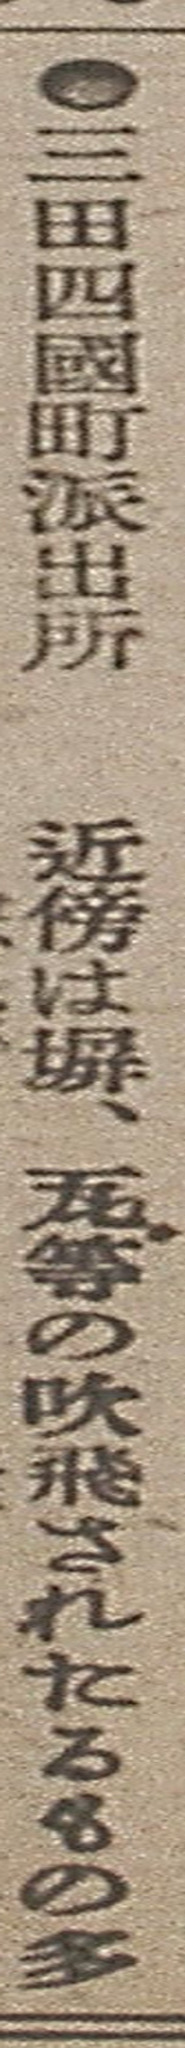●三田四国町派出所近傍は塀、瓦等の吹飛されたるもの多
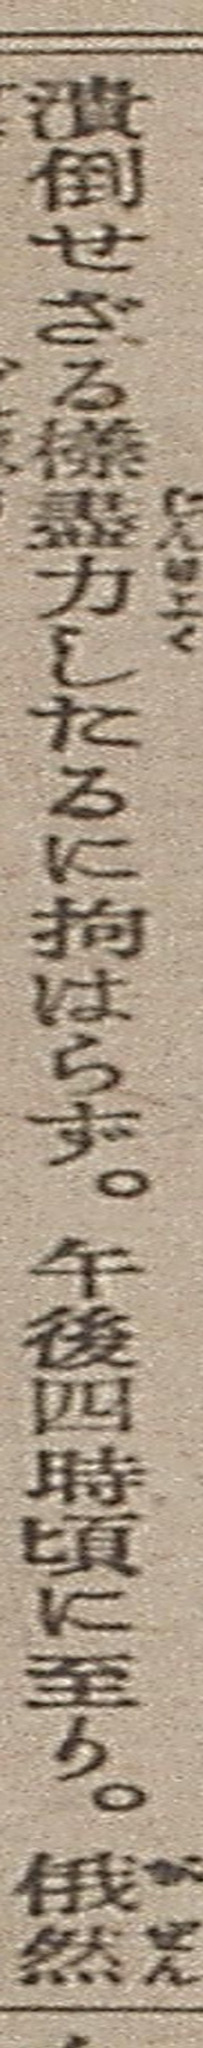潰倒せざる様尽力したるに拘はらず。午後四時頃に至り。俄然
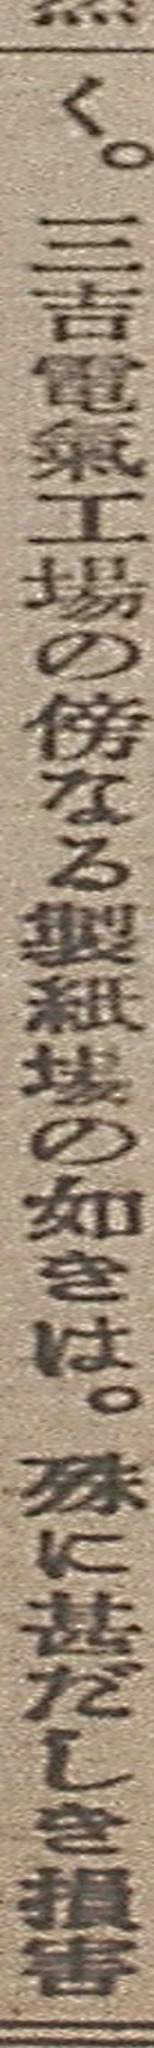く。三吉電機工場の傍なる製紙場の如きは。殊に甚だしき損害
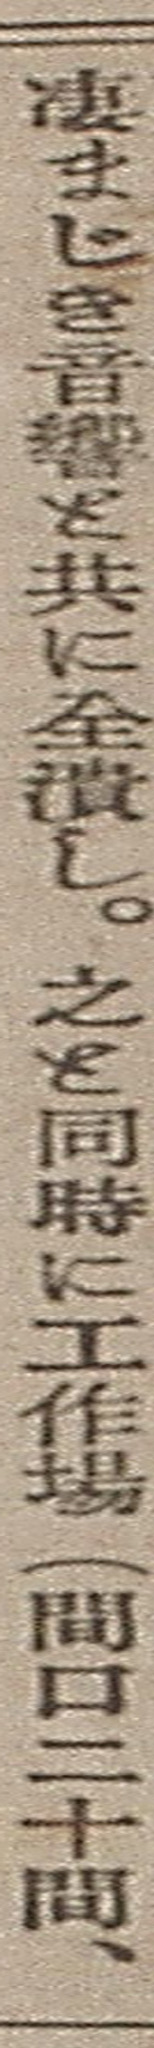凄まじき音響と共に全潰し。之と同時に工作場（間口二十間、
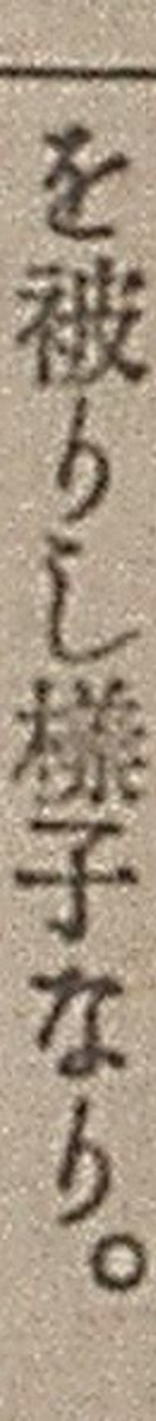を被りし様子なり。
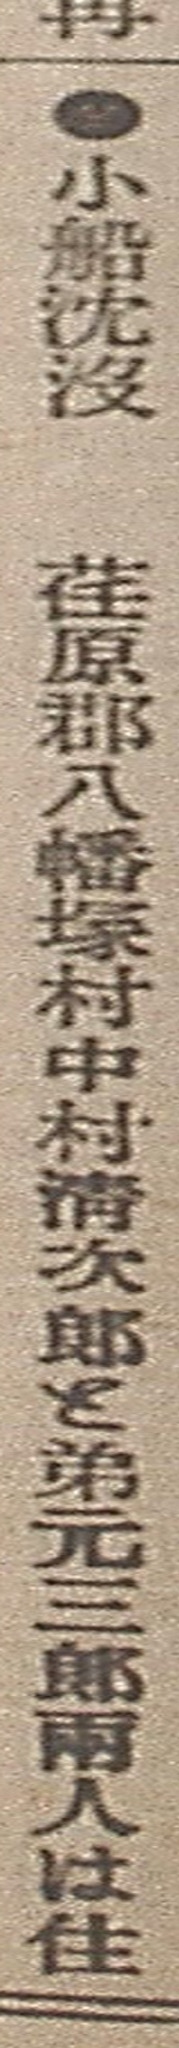●小船沈没荏原郡八幡塚村中村清次郎と弟元三郎両人は住
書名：風俗畫報臨時増刊第百九十九號　明治三十二年十月各地災害圖會（前編之續）
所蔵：東京大学地震研究所図書室 Earthquake Research Institute Library, The University of Tokyo, JAPAN
